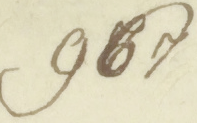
967
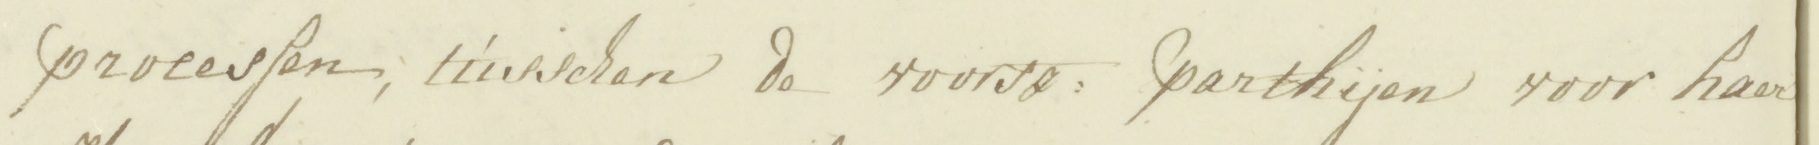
processen, tusschen de voorsz. parthijen voor haer
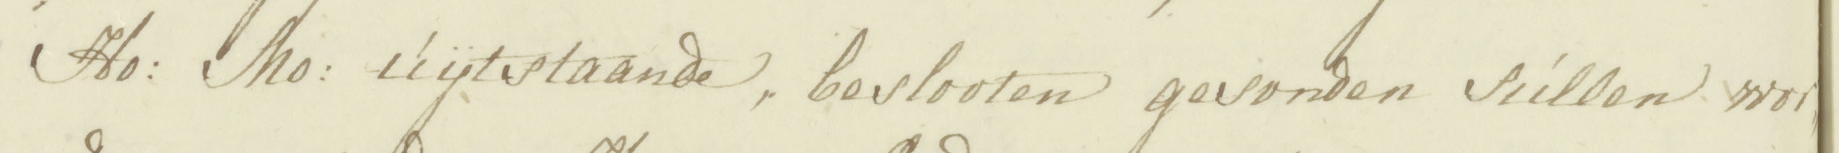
Ho:Mo: uijtstaande, beslooten gesonden sullen wor
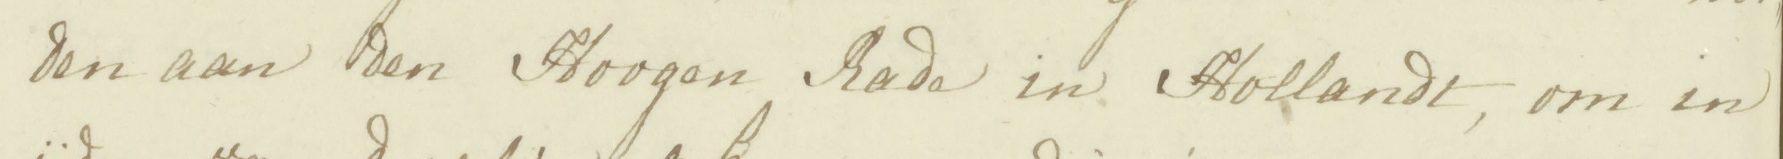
den aan den Hoogen Rade in Hollandt, om in
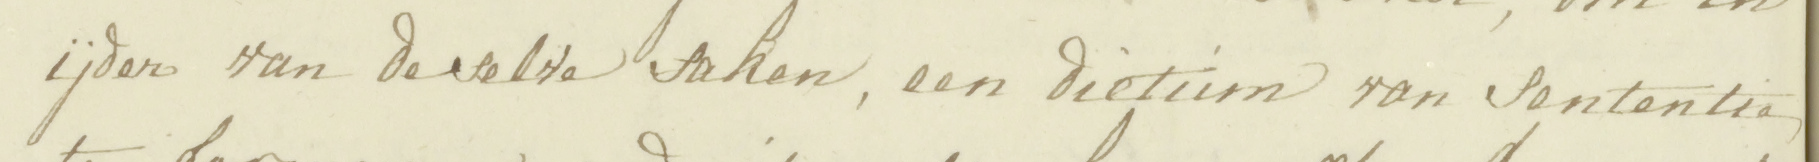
ijder van de selve saken, een dictum van sententie
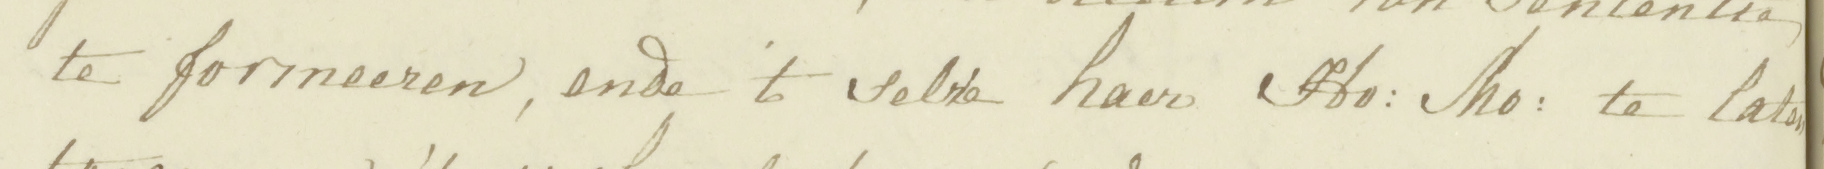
te formeeren, ende 't selve haer Ho:Mo: te laten
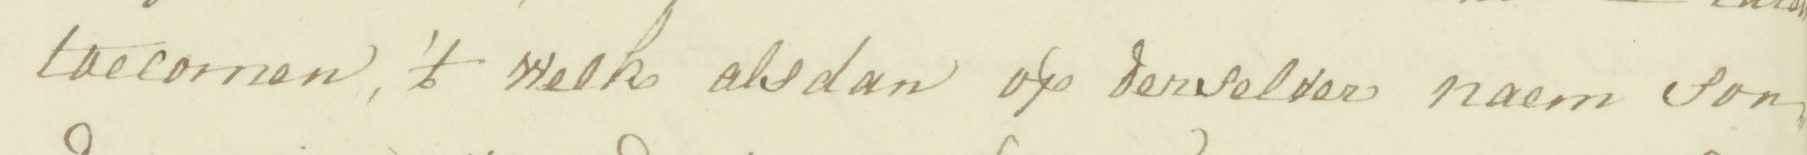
toecomen, 't welk alsdan op derselver naem son
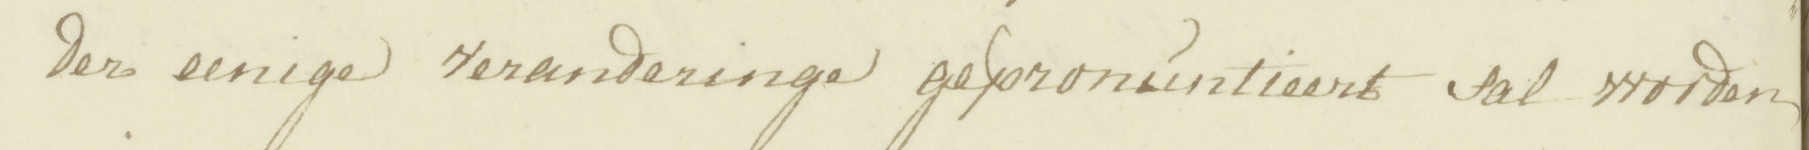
der eenige veranderinge gepronuntieert sal worden
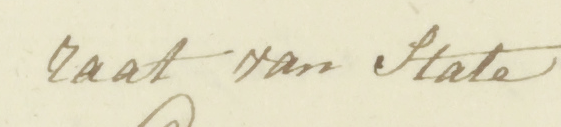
raat van State
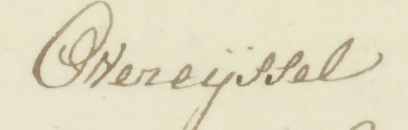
Overeijssel
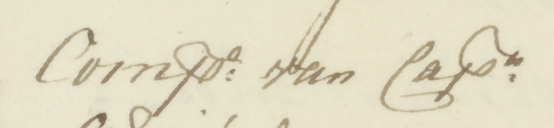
Compe: van Capn.
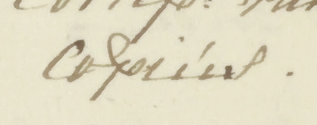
Copius
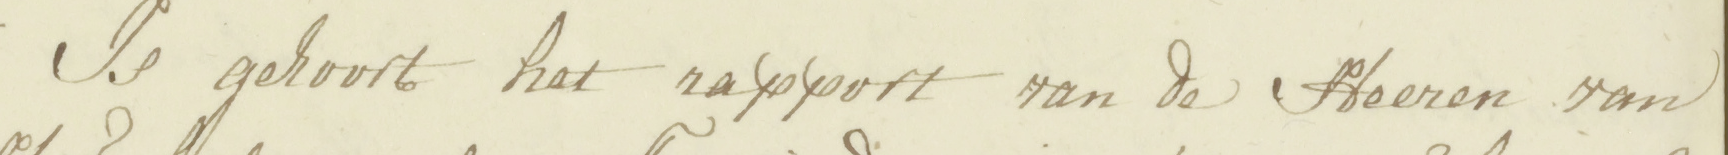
Is gehoort het rapport van de Heeren van
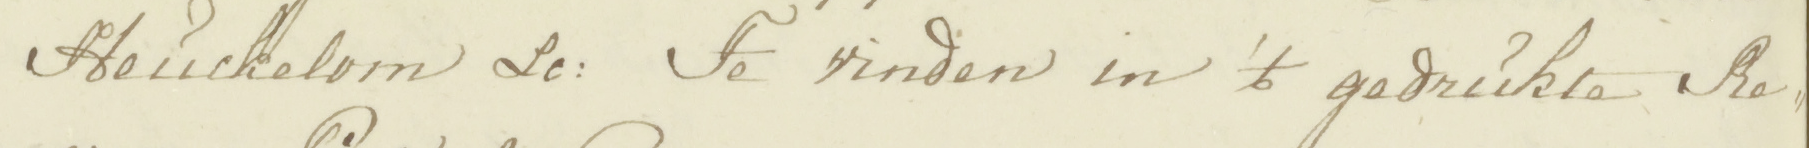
Houckelom & Te vinden in 't gedrukte Re„
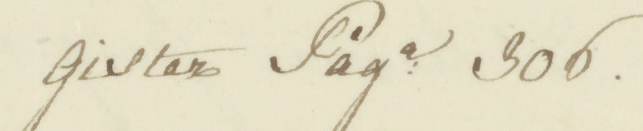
gister Paga: 306.
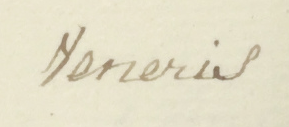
Veneris
